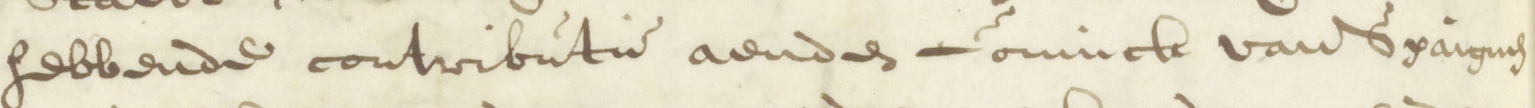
hebbende contributie aenden Coninck van Spaignen,
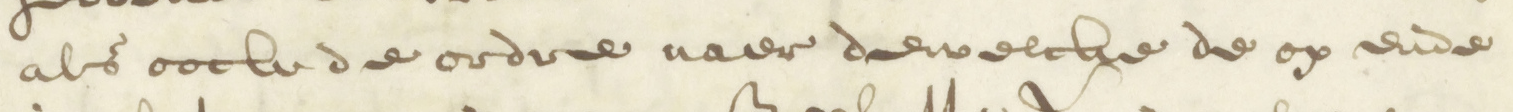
als oock de ordre naer dewelcke de op ende
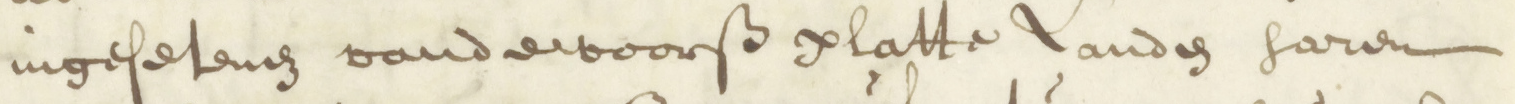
ingesetenen vande voors platte Landen haren
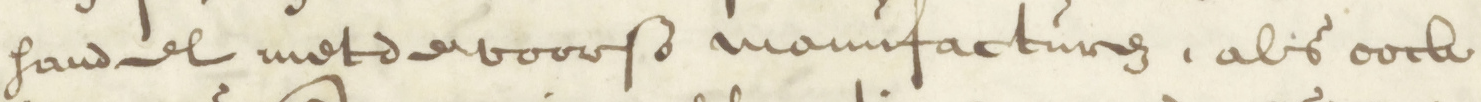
handel met de voors manufacturen, als oock
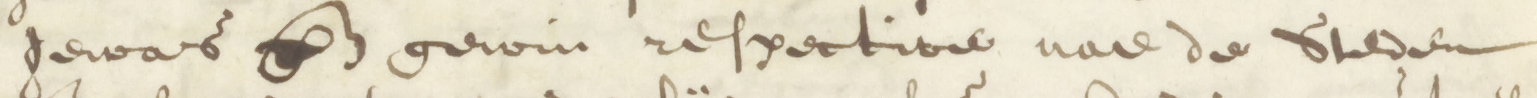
gewas & gewin respective nae de Steden
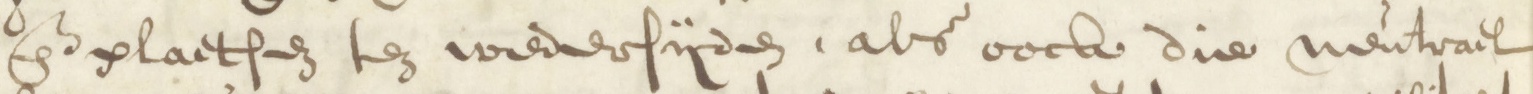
& plaetsen ten wedersijden, als oock die neutrael
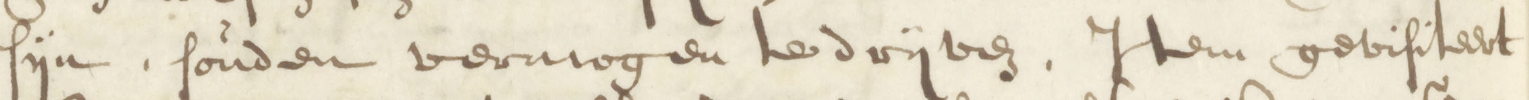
sijn, souden vermogen te drijven. Item gevisiteert
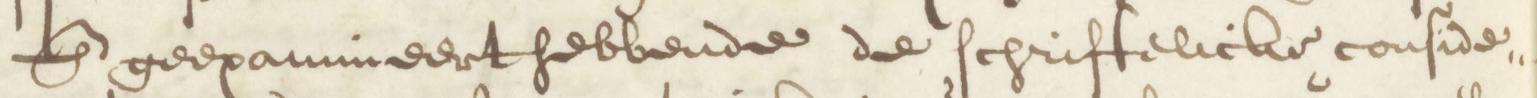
& geexamineert hebbende de schriftelicke conside„
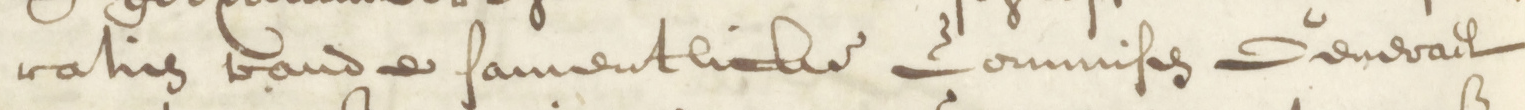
ratien vande samentlicke Commisen Generael
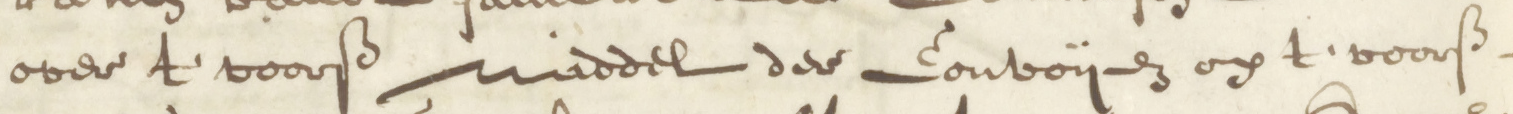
over t' voors Middel der Convoijen op t' voors
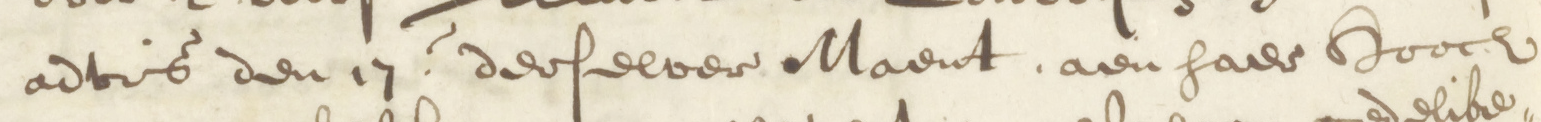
advis den 17e. derselver Maent, aen haer Hooch
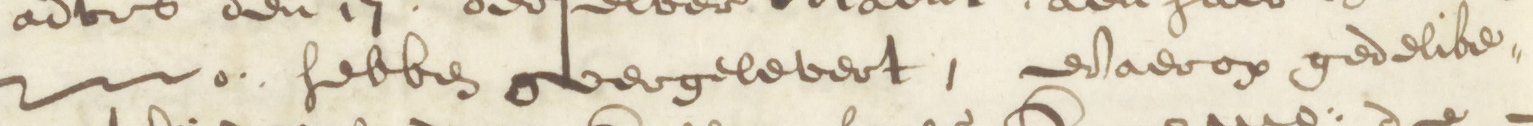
Mo: hebben overgelevert. Waerop gedelibe„
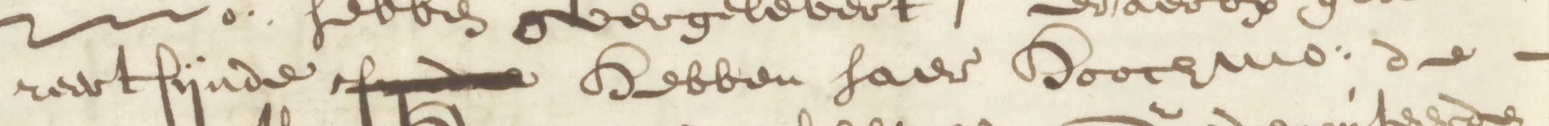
reert sijnde sijnde Hebben haer HoochMo: de
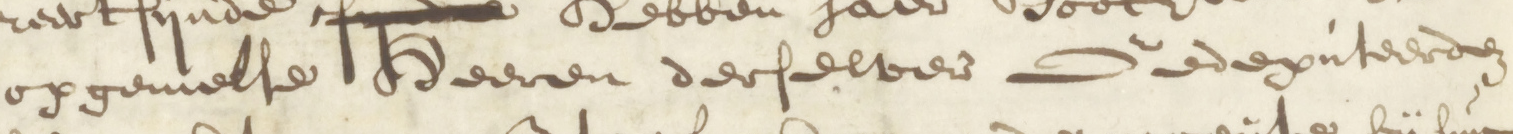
opgemelte Heeren derselver Gedeputeerden
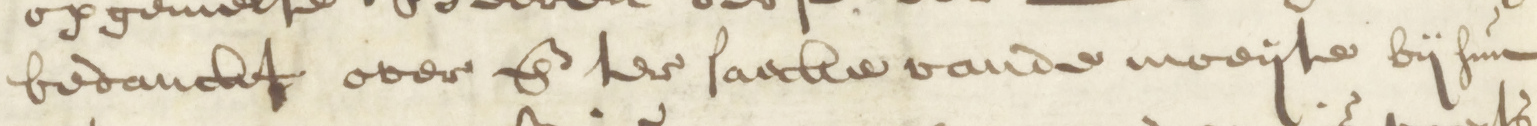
bedanckt over & ter saecke vande moeijte bij hun
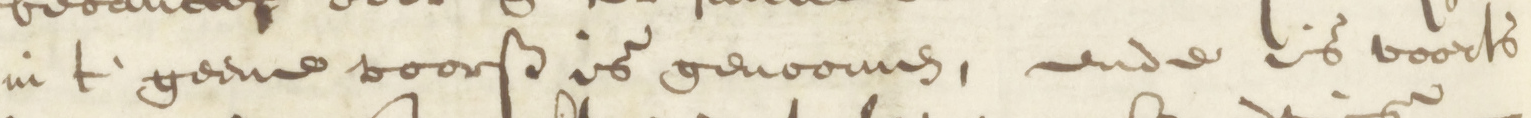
in t‛ geene voors is genoomen, ende is voorts
